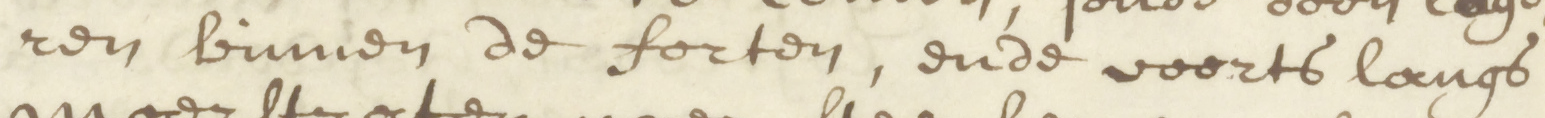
ren binnen de forten, ende voorts langs
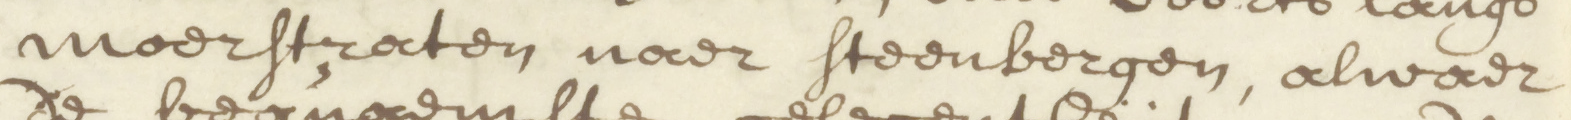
moerstraten naer steenbergen, alwaer
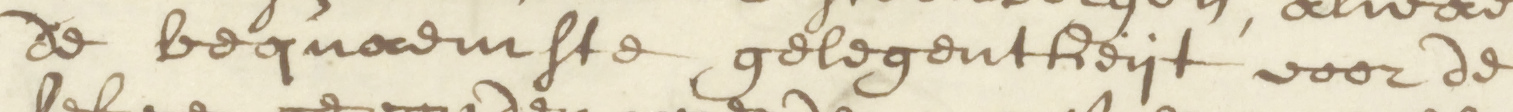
de bequaemste gelegentheijt voor de
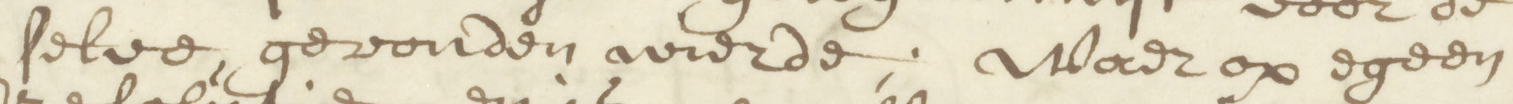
selve gevonden wierde; Waerop egeen
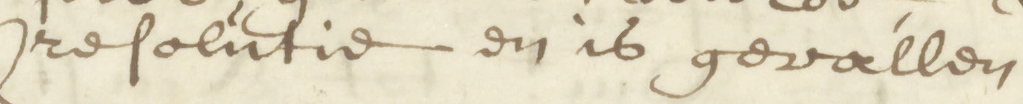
resolutie en is gevallen
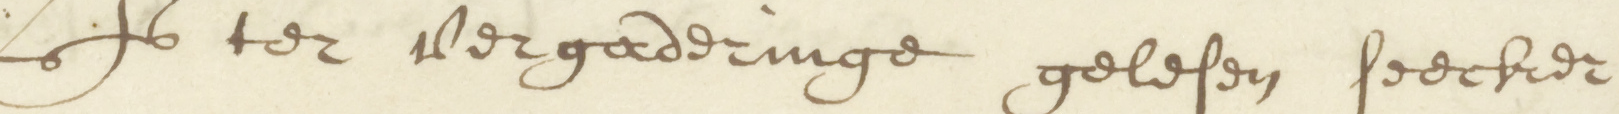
Is ter Vergaderinge gelesen seecker
